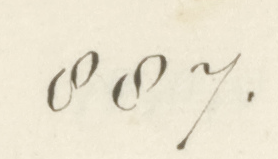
887.
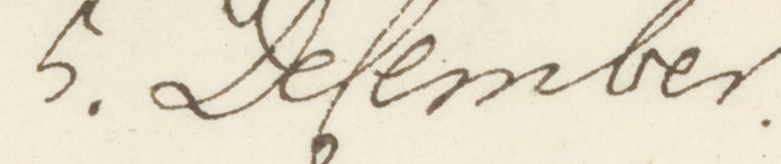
5. December.
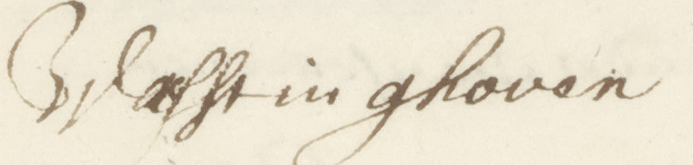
Woestinghoven
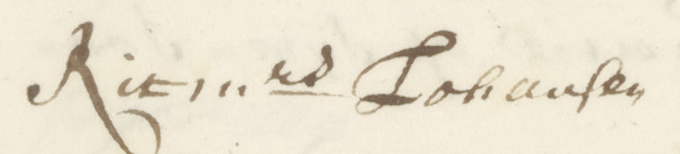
Ritmrs Lohansen
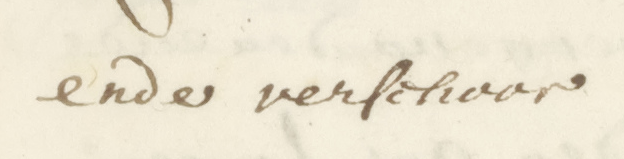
ende verschoor
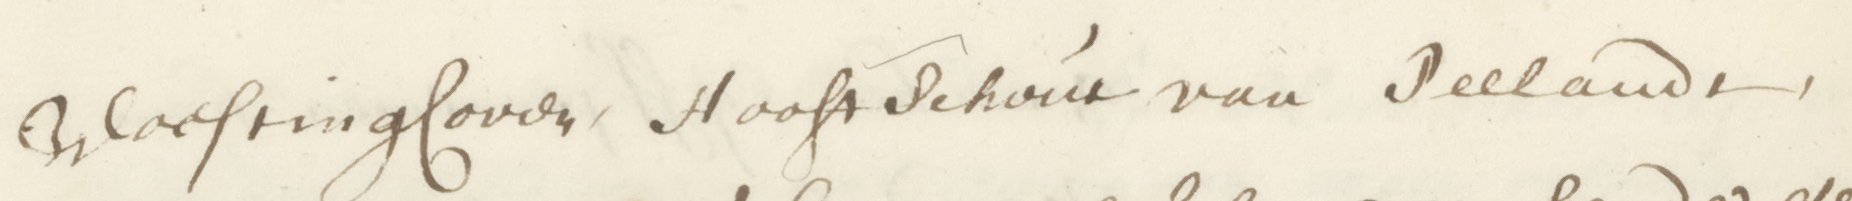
Woestinghoven, Hooftschout van Peelandt,
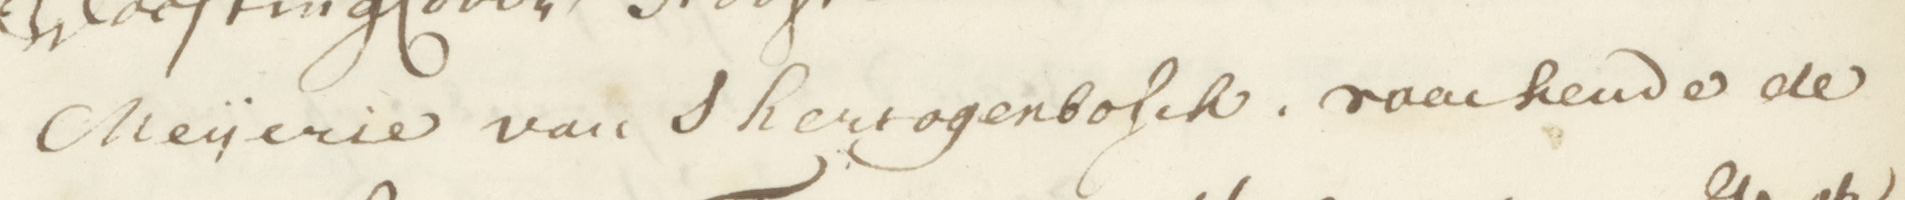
Meijerie van shertogenbosch, raackende de
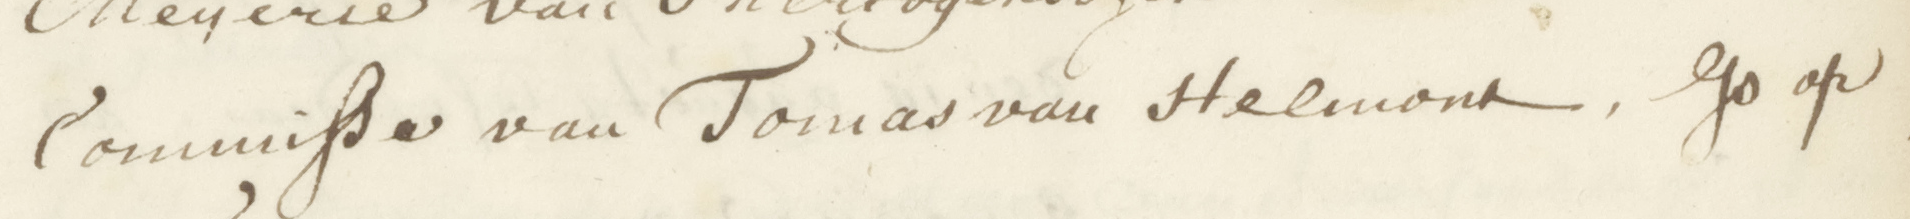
Commisse van Tomas van Helmont, Is op„
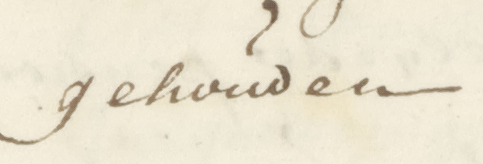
gehouden
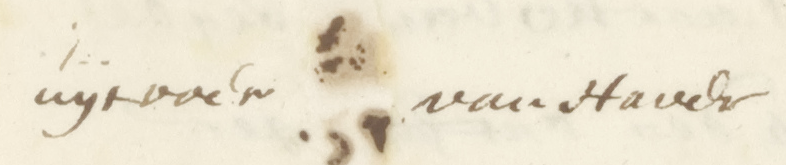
uijtvoer van Haver
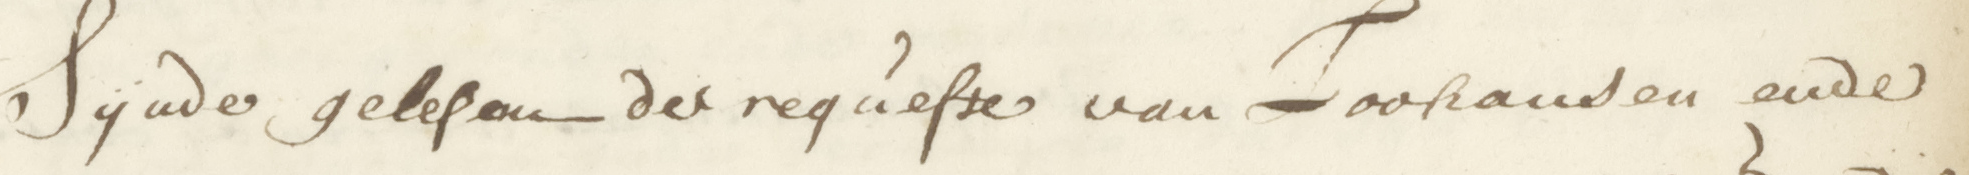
Sijnde gelesen de requeste van Loohansen ende
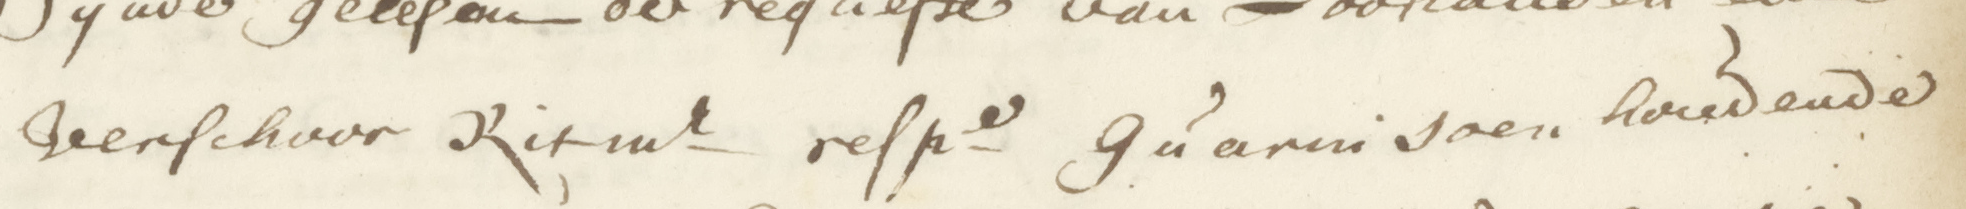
verschoor Ritmr respe. Guarnisoen houdende
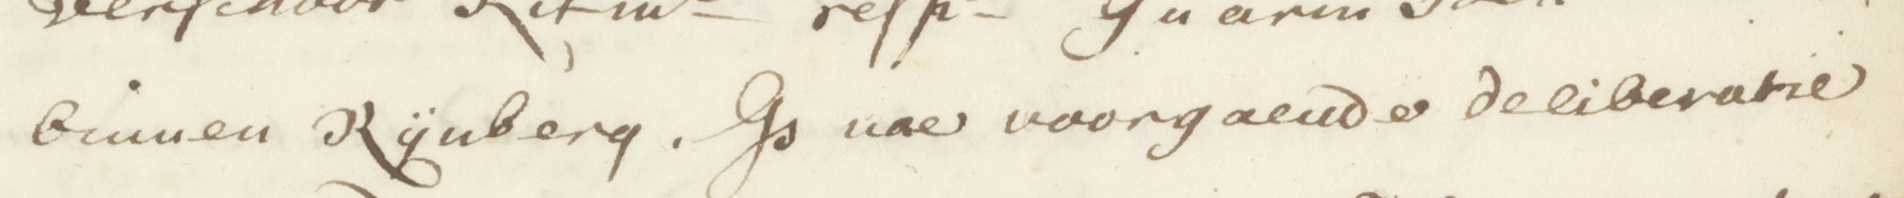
binnen Rijnberg. Is nae voorgaende deliberatie
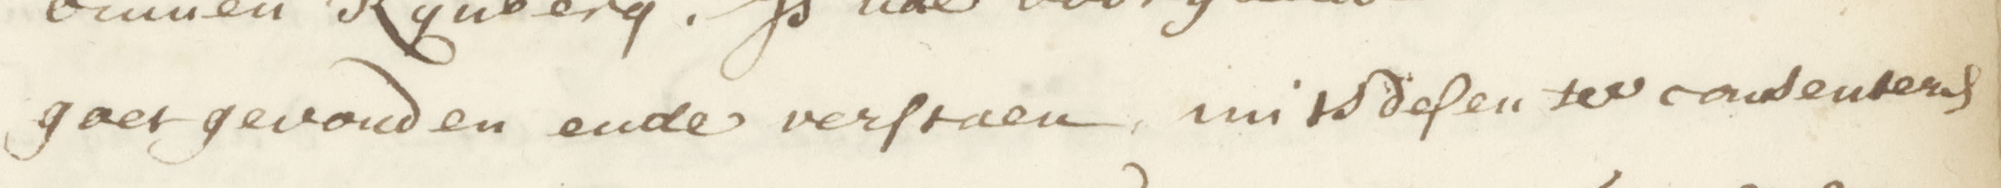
goet gevonden ende verstaen, mitsdesen te consenteren
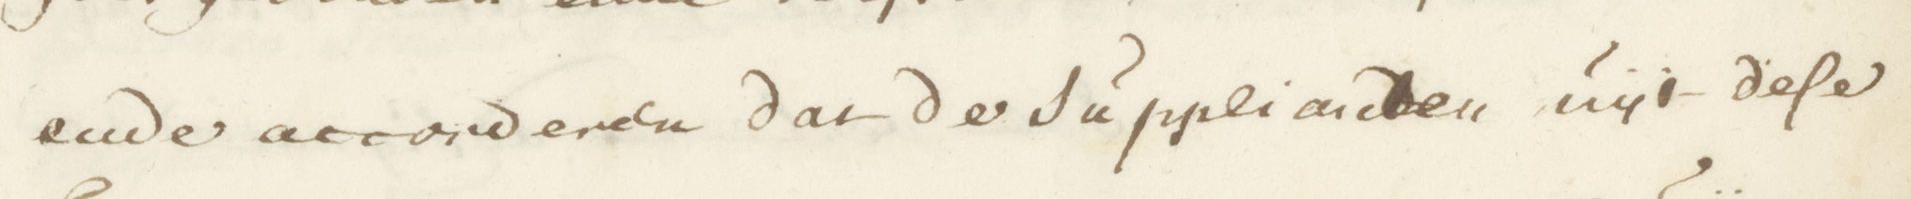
ende accorderen dat de supplianten uijt dese
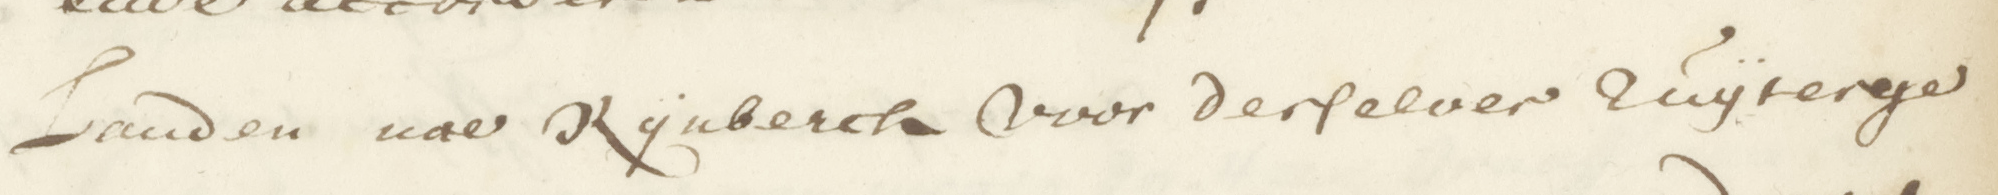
Landen nae Rijnberck voor derseluer ruijterye
